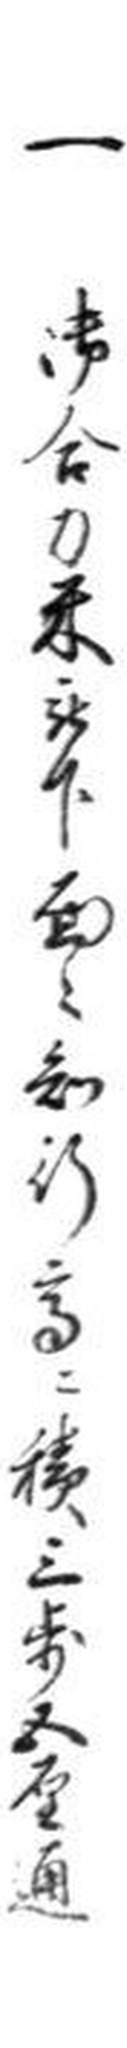一御合力米被下面々知行高ニ積三歩五厘通
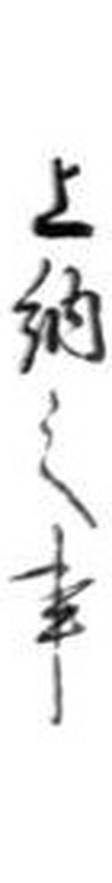上納之事
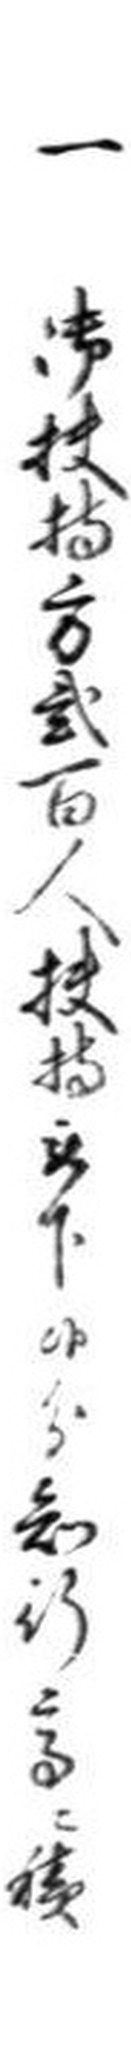一御扶持方弐百人扶持被下候分知行高ニ積
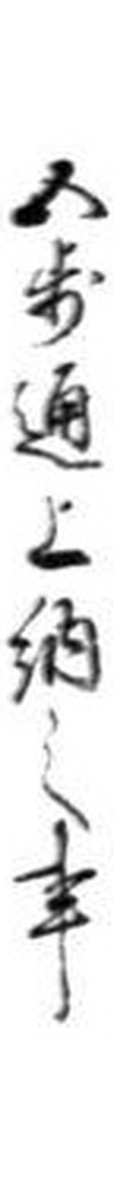五歩通上納之事
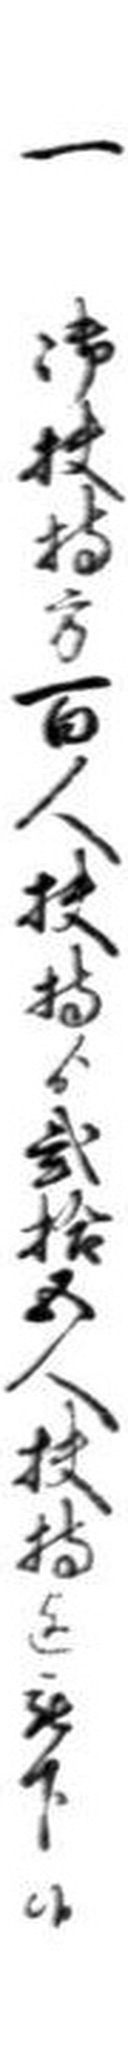一御扶持方百人扶持ゟ弐拾五人扶持迄被下候
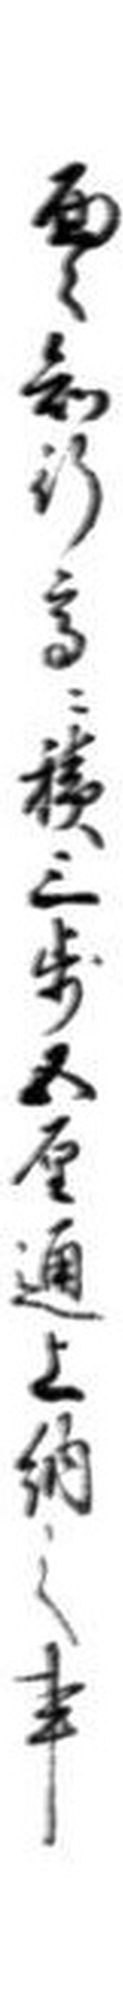面々知行高ニ積三歩五厘通上納之事
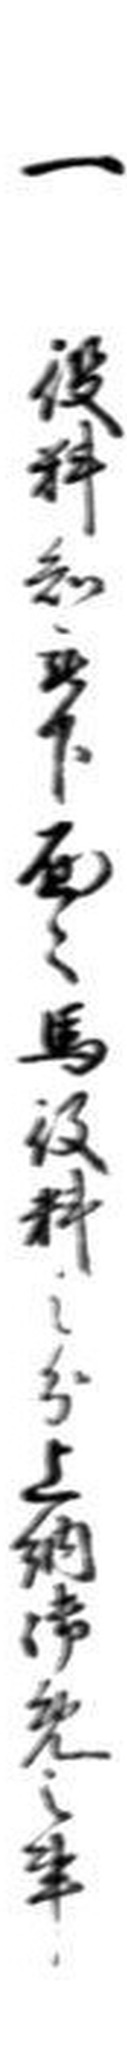一役料知被下面々馬役料之分上納免之事
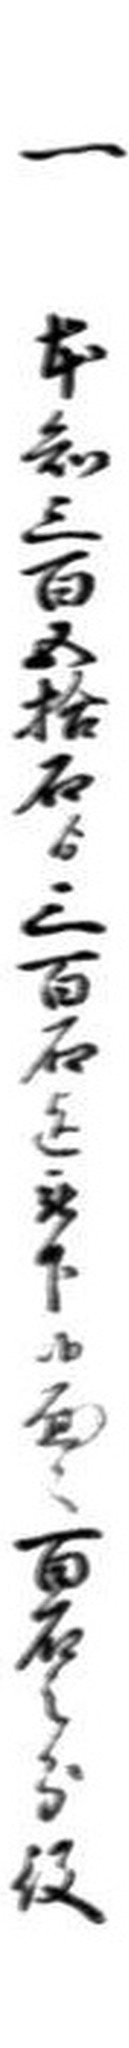一本知三百五拾石ゟ三百石迄被下候面々百石之分役
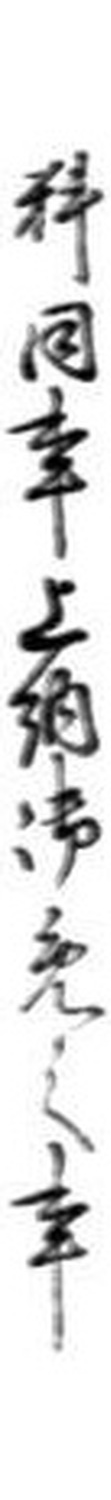料同事上納御免之事
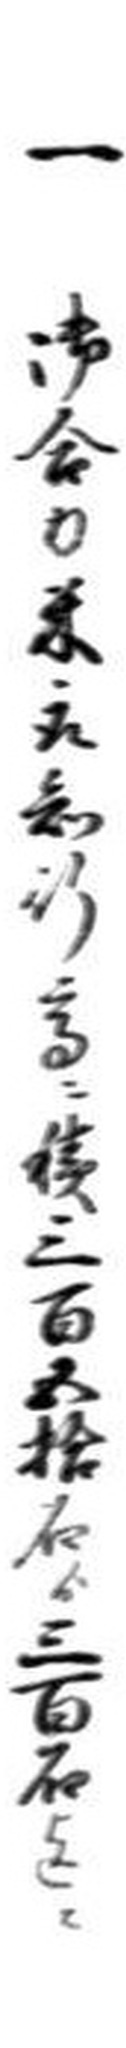一御合力米取知行高ニ積三百五拾石ゟ三百石迄ニ
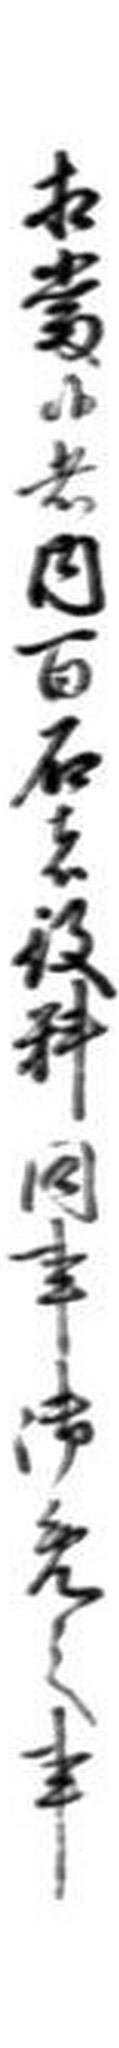相当候者内百石者役料同事御免之事
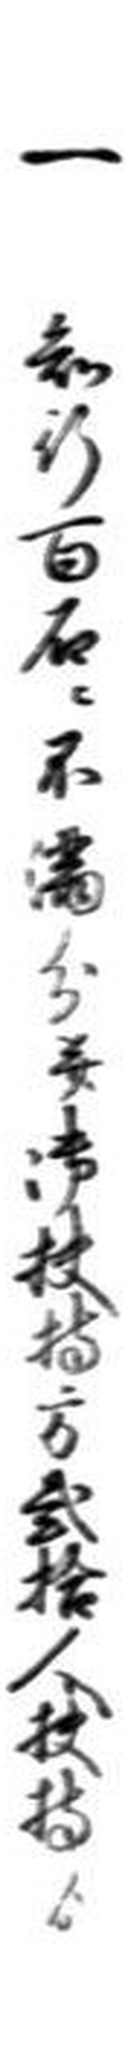一知行百石ニ不満分并御扶持方弐拾人扶持ゟ
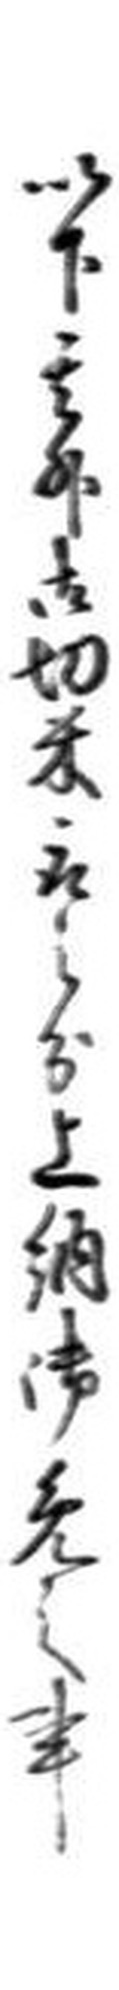以下其外御切米取之分上納御免之事
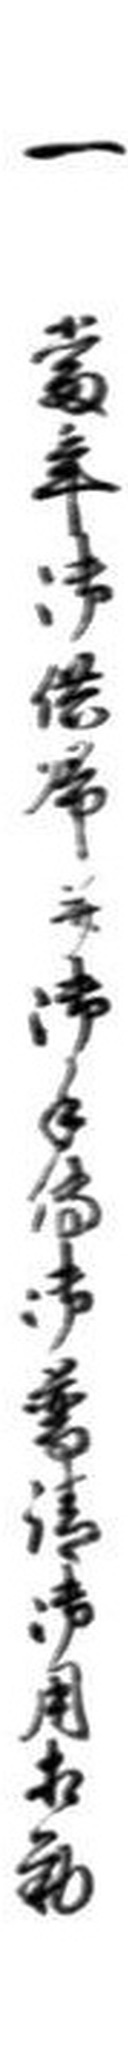一当年御供帰并御手伝御普請御用相勤
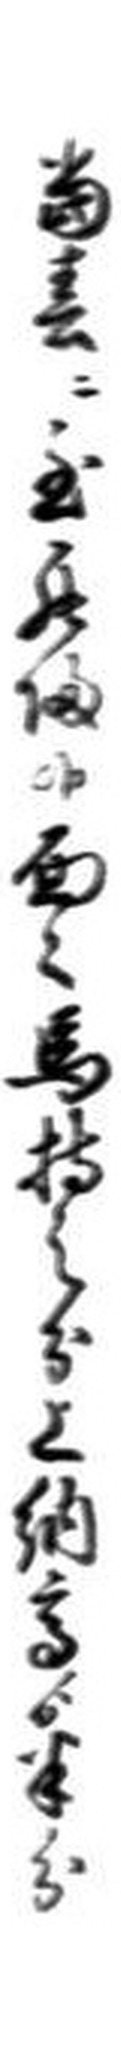当春ニ至罷帰候面々馬持之分上納高ゟ半分

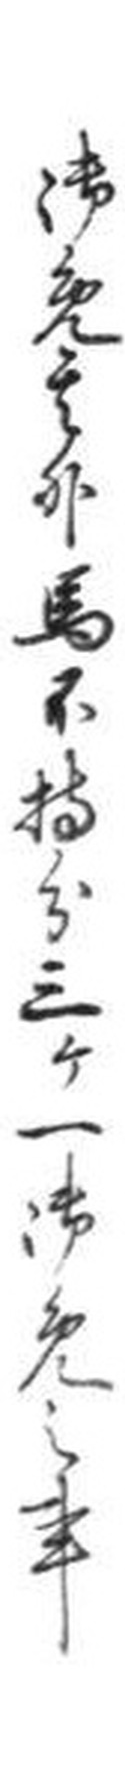御免其外馬不持分三ケ一御免之事
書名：家譜 三十二 吉邦公 従享保二年到享保三年
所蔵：福井県文書館 Fukui Prefectural Archives
